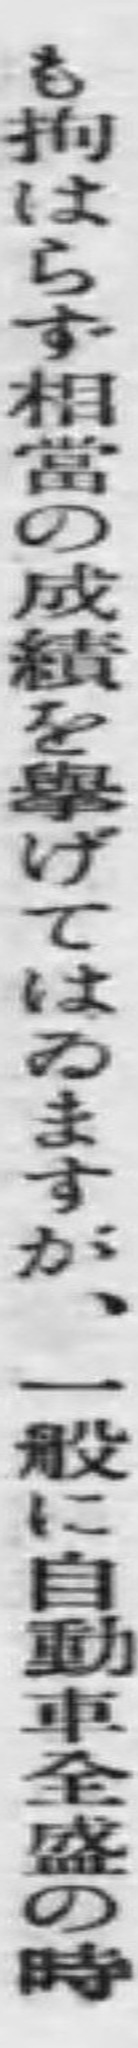も拘はらず相當の成績を挙げてはゐますが、一般に自動車全盛の時
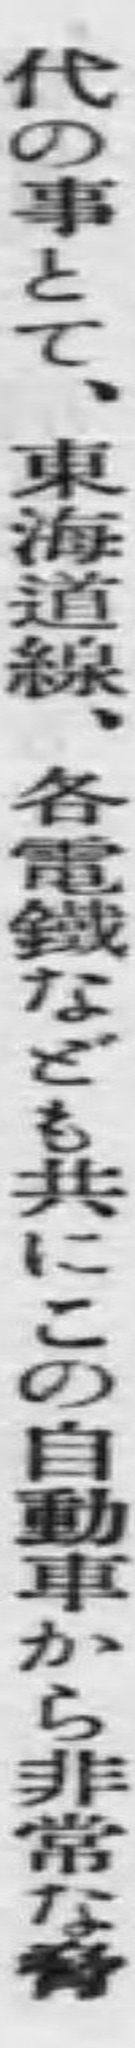代の事とて、東海道線、各電鐵なども共にこの自動車から非常な脅
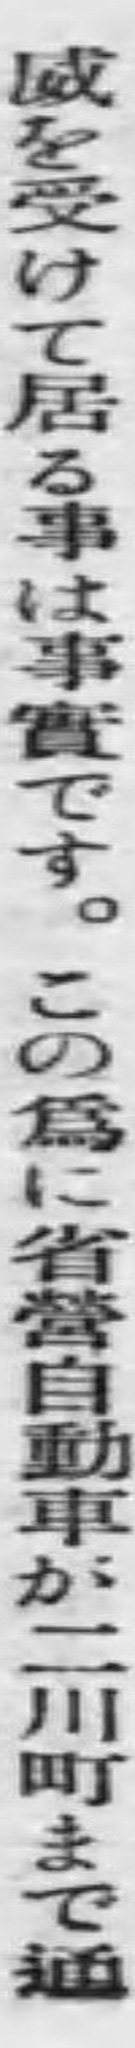威を受けて居る事は事實です。この為に省營自動車が二川町まで通
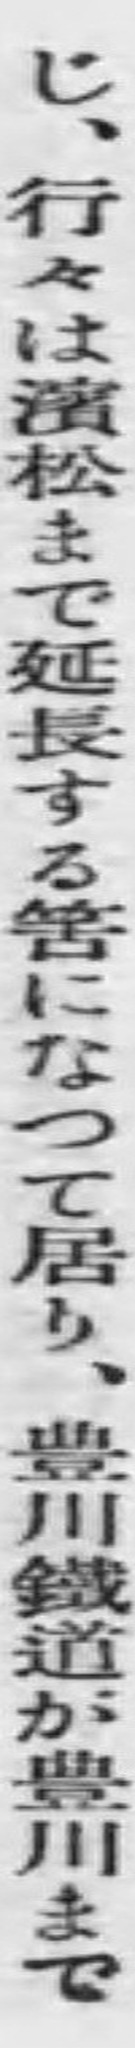じ、行々は濱松まで延長する筈になつて居り、豊川鐵道が豊川まで
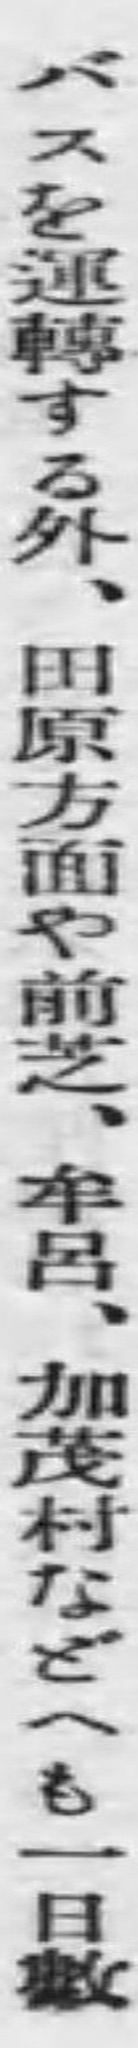バスを運轉する外、田原方面や前芝、牟呂、加茂村などへも一日数
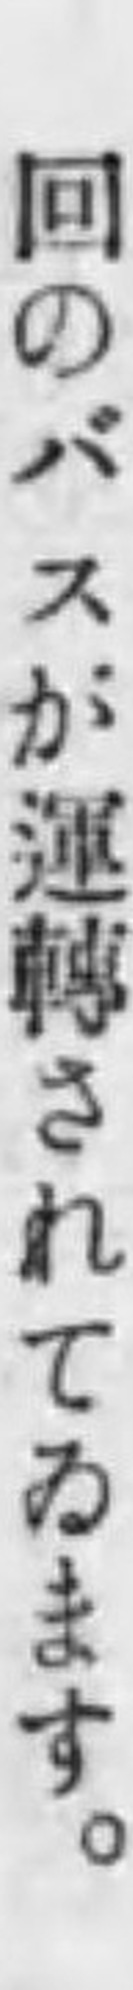回のバスが運轉されてゐます。
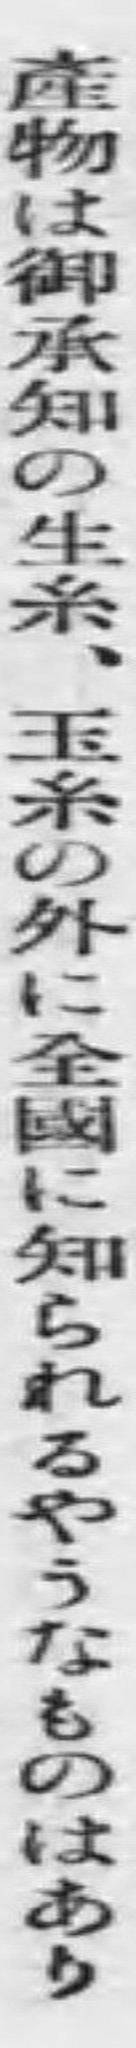産物は御承知の生糸、玉糸の外に全國に知られるやうなものはあり
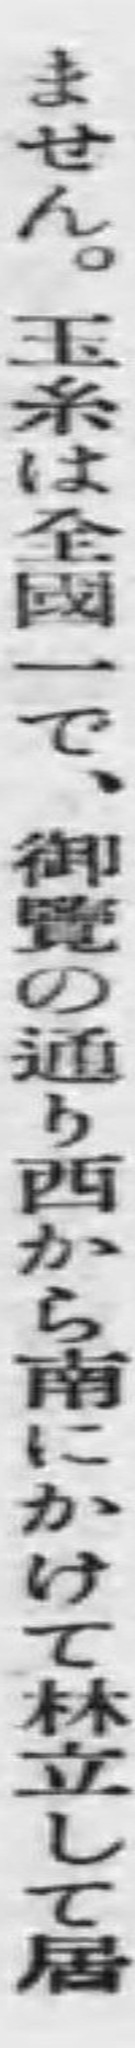ません。玉糸は全國一で、御覧の通り西から南にかけて林立して居
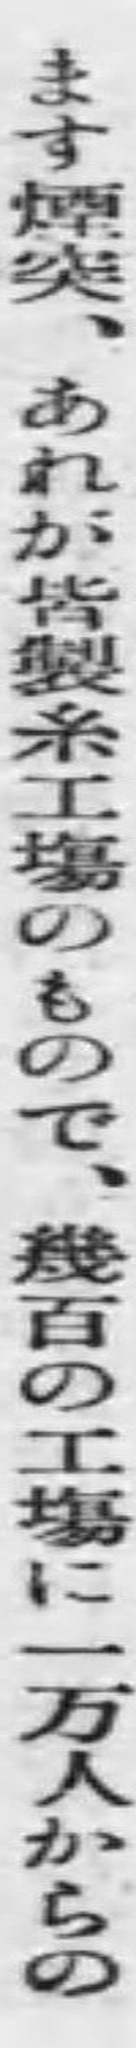ます煙突、あれが皆製糸工場のもので、幾百の工塲に一万人からの
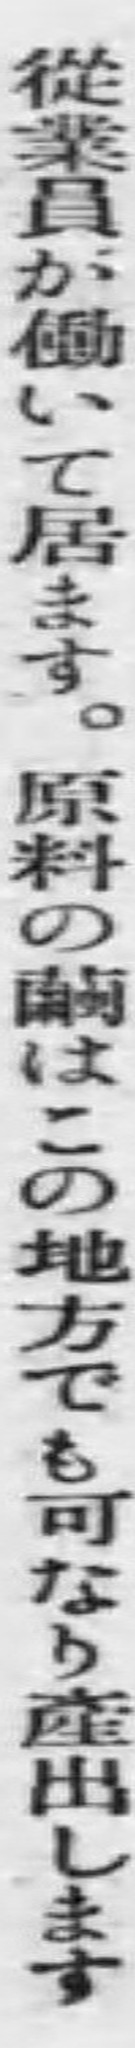従業員が働いて居ます。原料の繭はこの地方でも可なり産出します
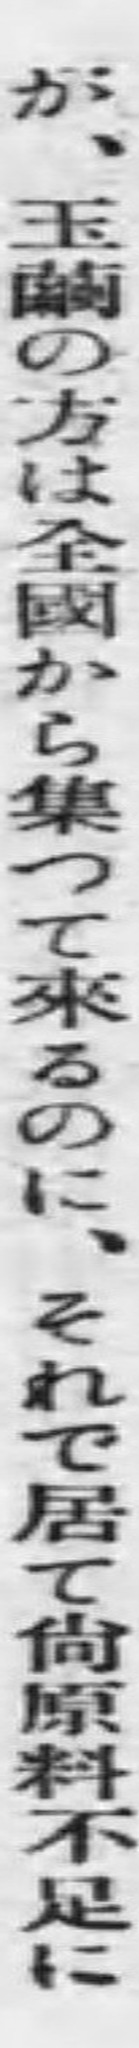が、玉繭の方は全國から集つて來るのに、それで居て尚原料不足に

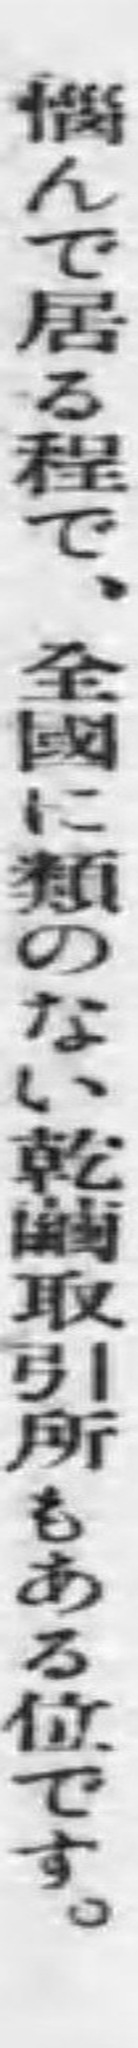悩んで居る程で、全國に類のない乾繭取引所もある位です。
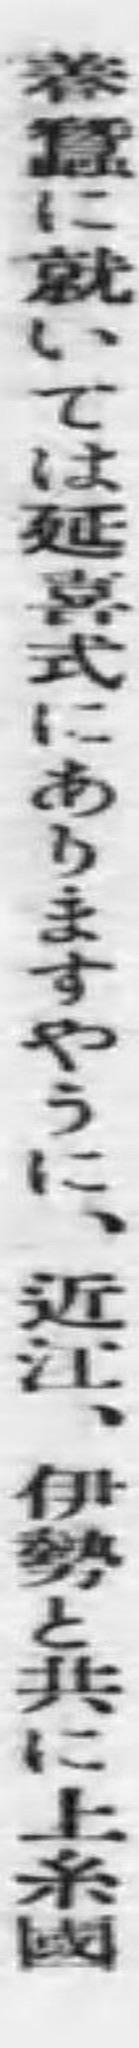養蠶に就いては延喜式にありますやうに、近江、伊勢と共に上糸國
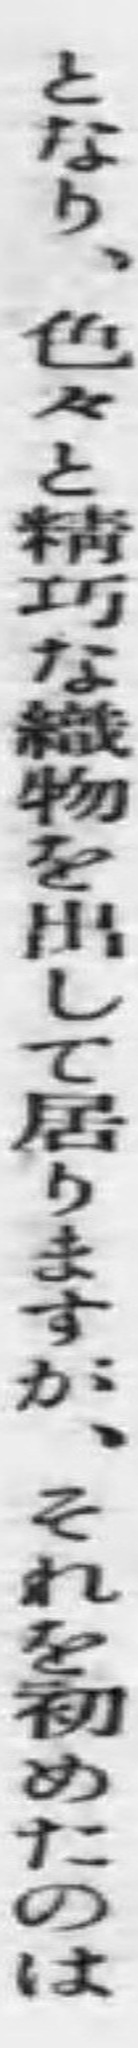となり、色々と精巧な織物を出して居りますが、それを初めたのは
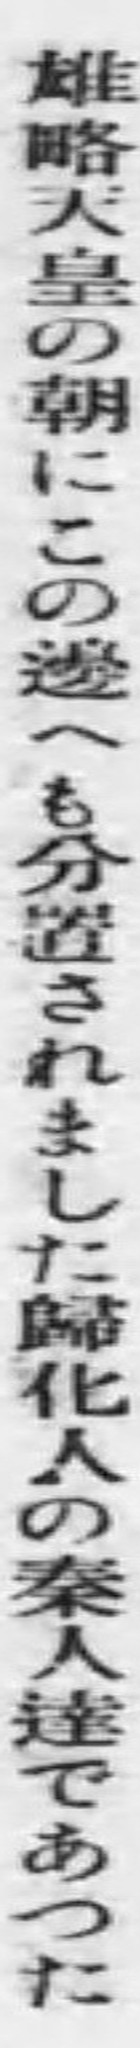雄略天皇の朝にこの邊へも分置されました帰化人の泰人達であつた
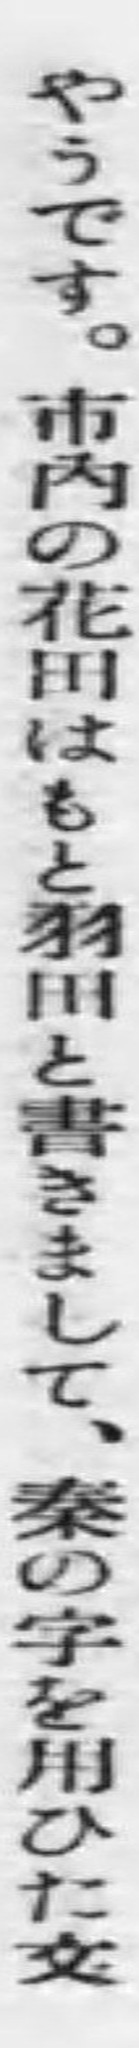やうです。市内の花田はもと羽田と書きまして、泰の字を用ひた文
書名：東三河道中記 : 豊橋市及其附近案内
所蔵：国立国会図書館 National Diet Library, JAPAN
